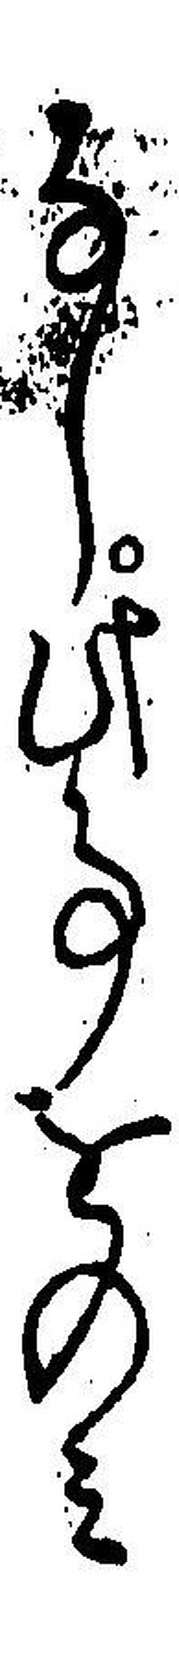なし。此事をのみ
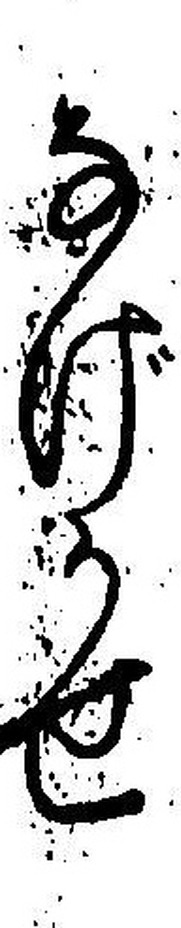なげかせ
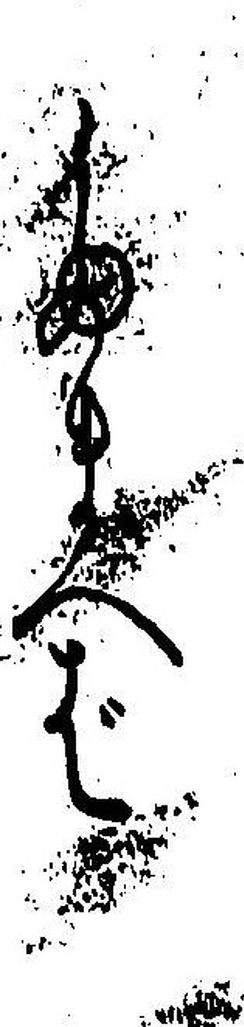たまへば

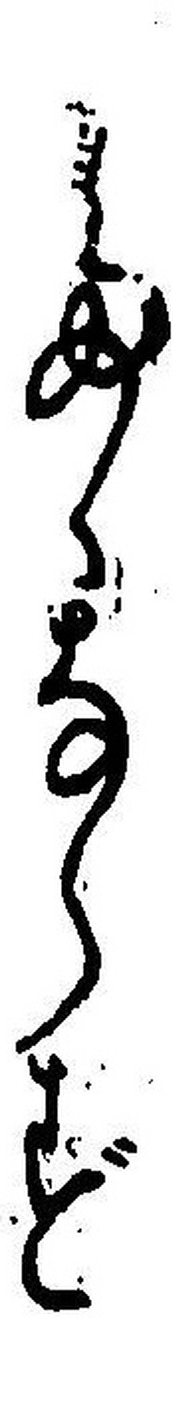たゝならず
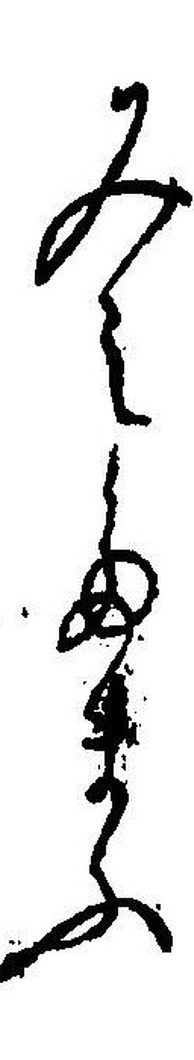みえたまふ
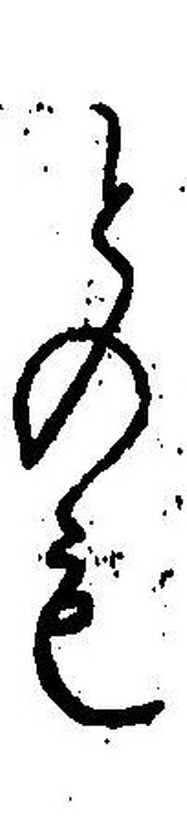とのも
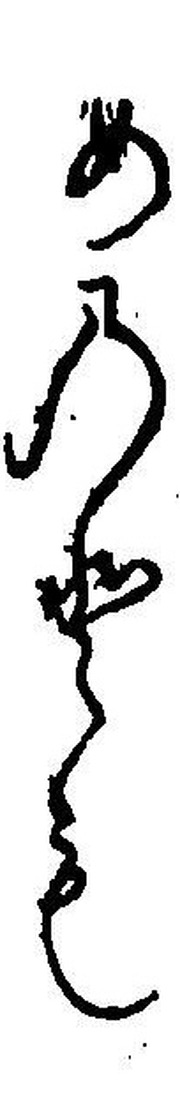めのとも
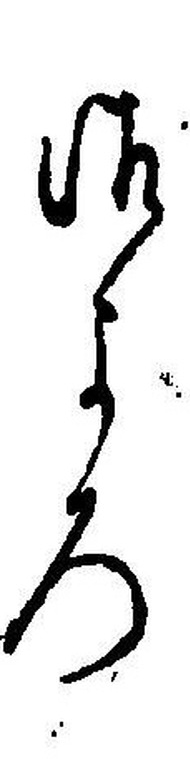御よろ
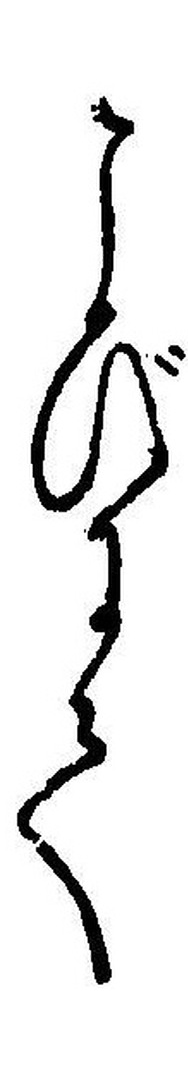こびにて
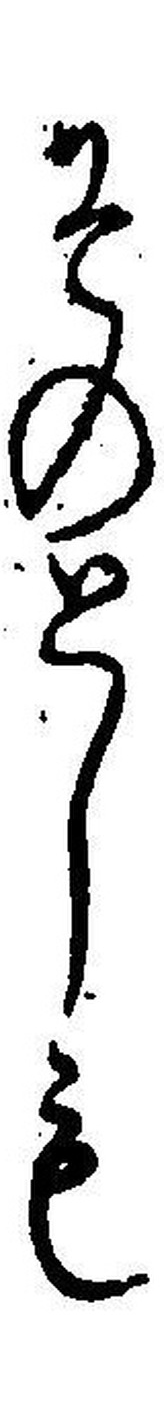そのとしも
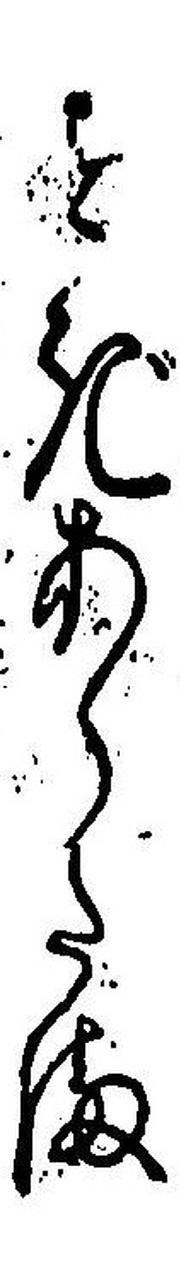すぎあらたま
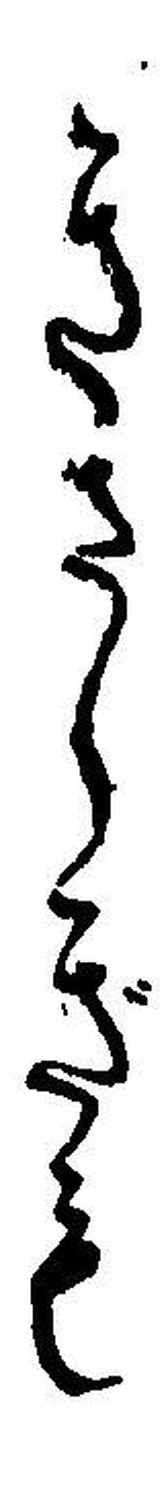きさらぎも
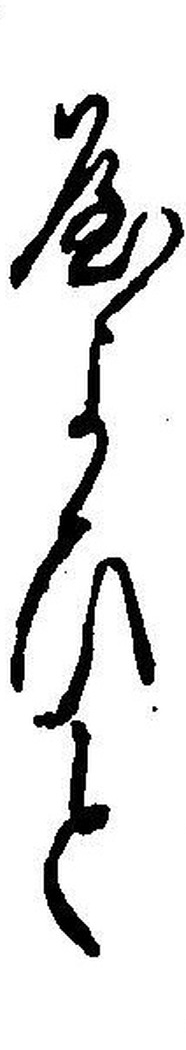やよひと
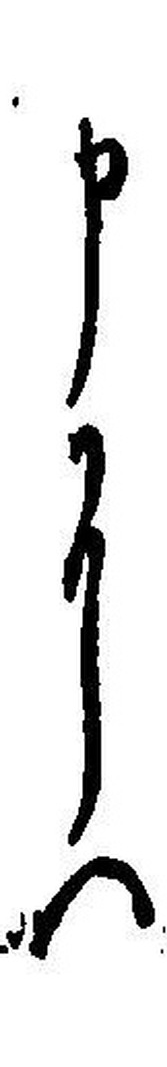申には

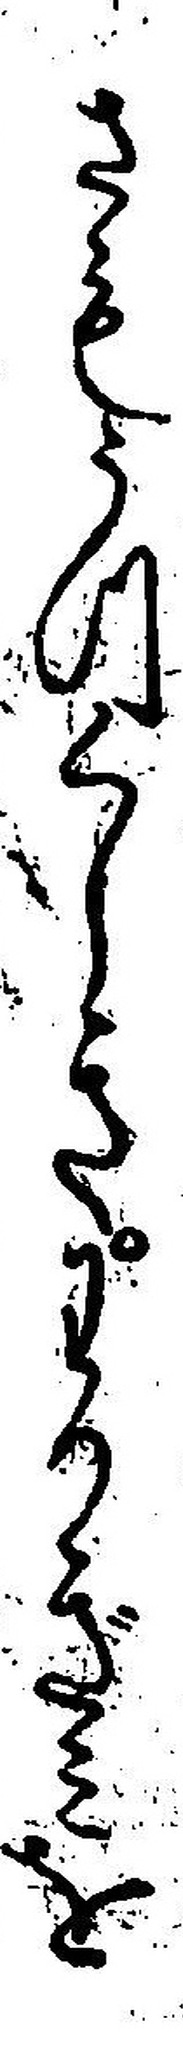さもうつくしき。わかぎみを
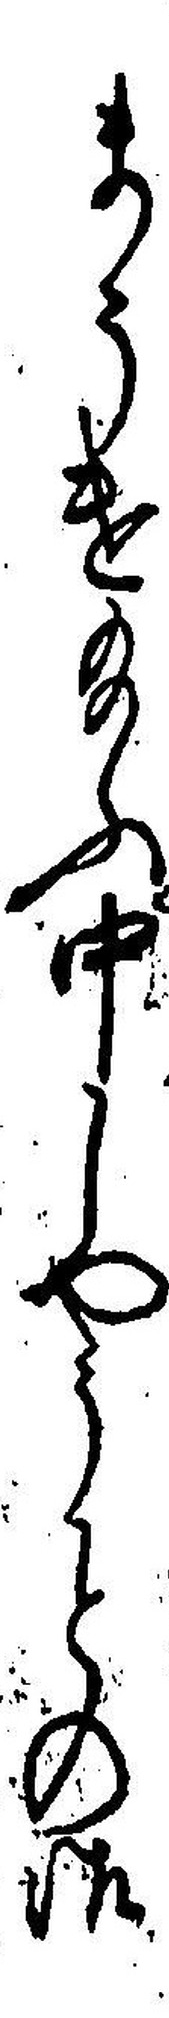もうけ給ふ。中しやうとの御
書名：木幡きつね
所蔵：東京大学総合図書館 General Library in the University of Tokyo, JAPAN
